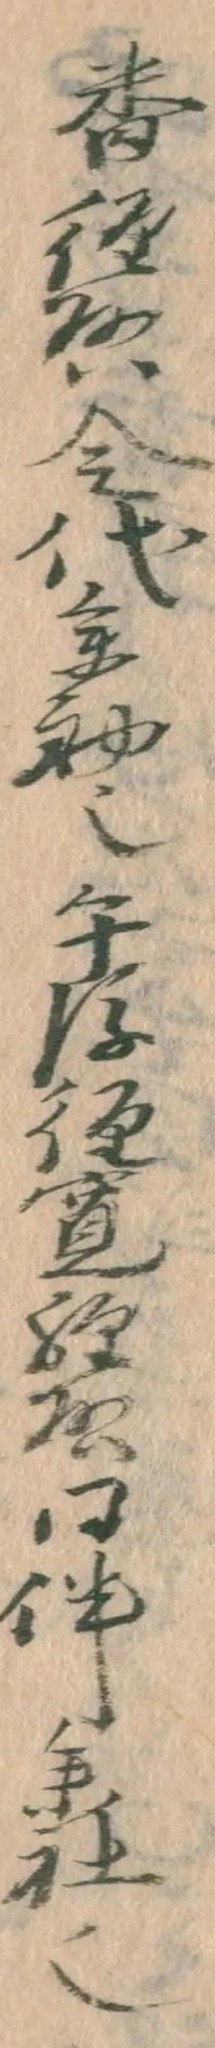番経啓令代参勤之午後経寛経啓同伴参社也
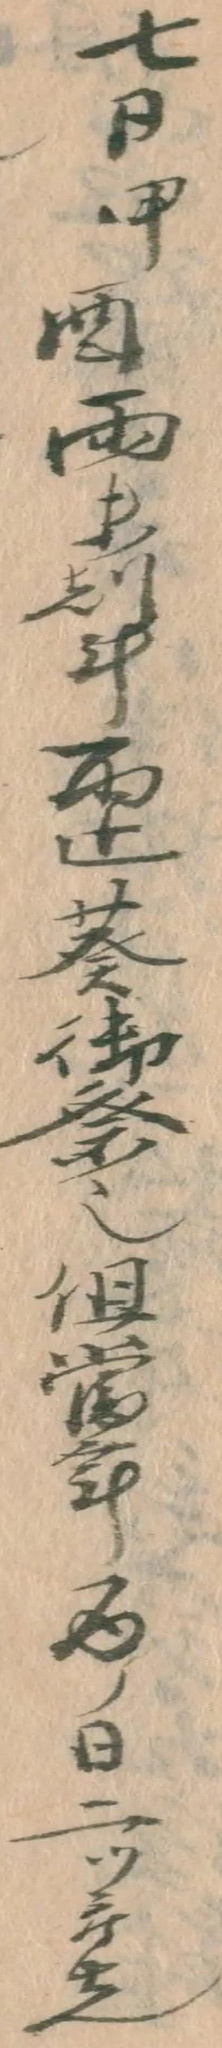七日甲酉雨未刻斗雨止葵御祭也但當年酉ノ日二ツニ付先
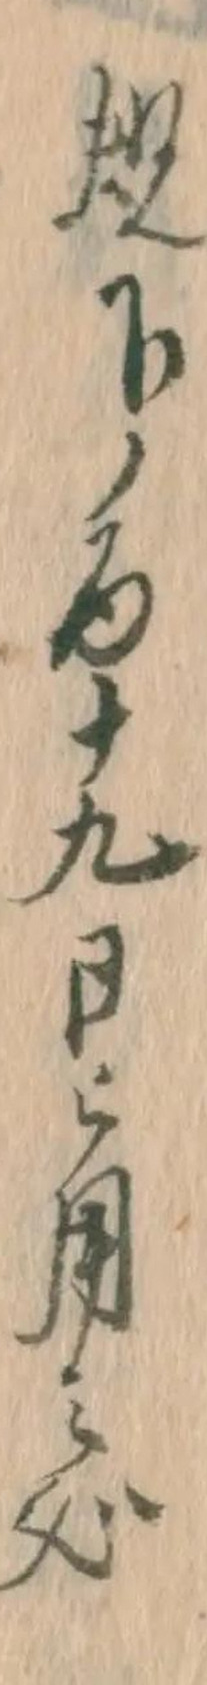規下ノ酉十九日被用之処
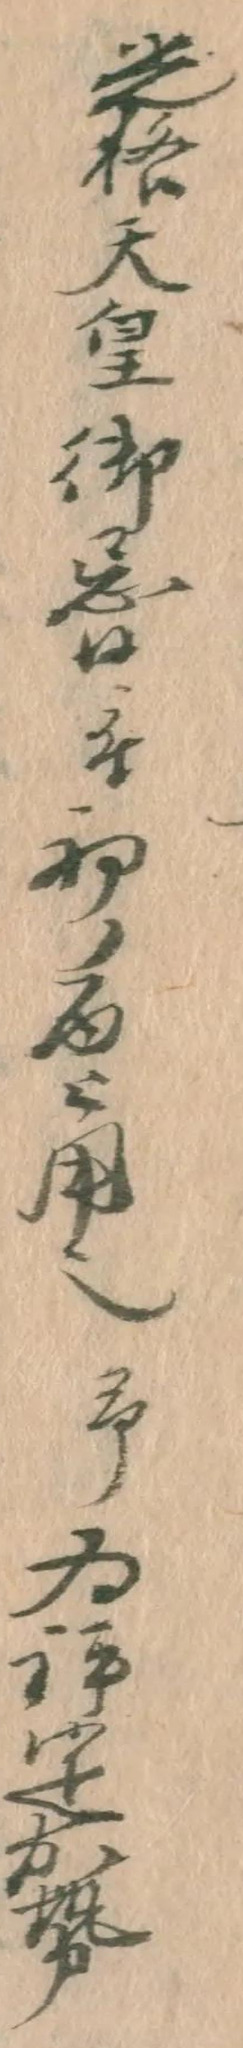光格天皇御忌日ニ付初ノ酉被用也予為評定加勢
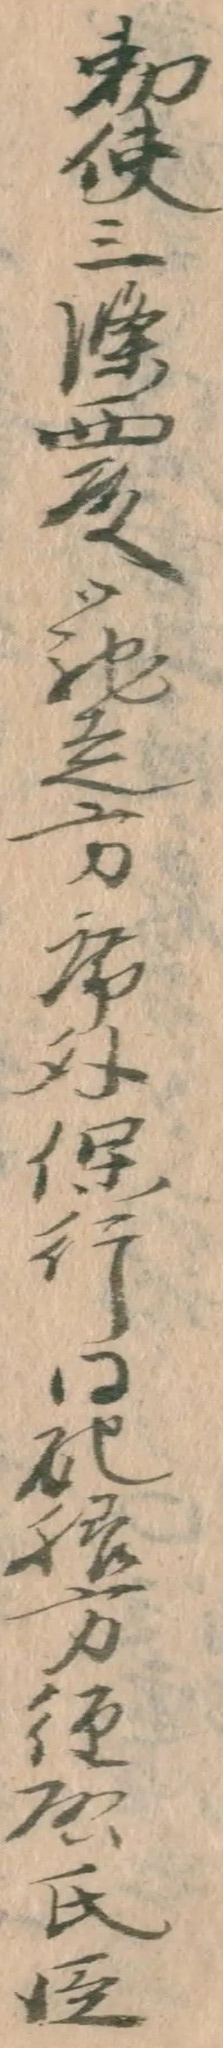勅使三條西殿御馳走方席外保行同配膳方経啓氏臣
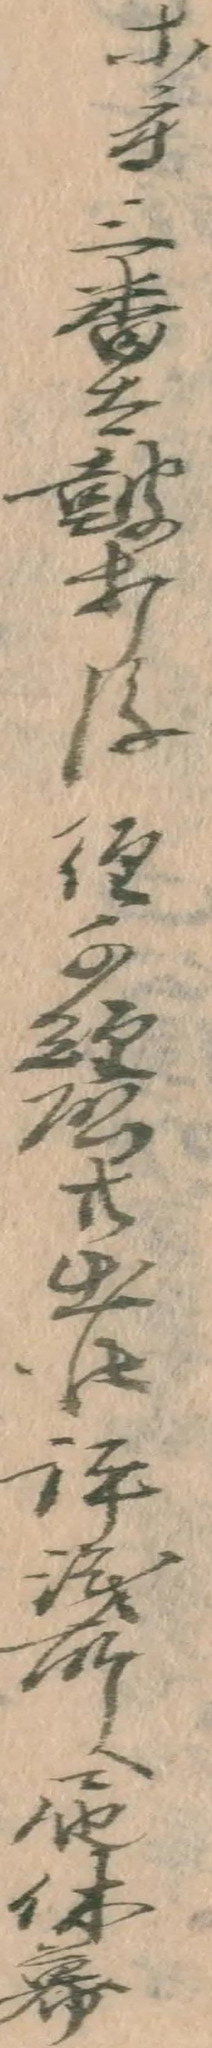等二付三番太皷打後経千経啓共出仕評議所へ届休幕
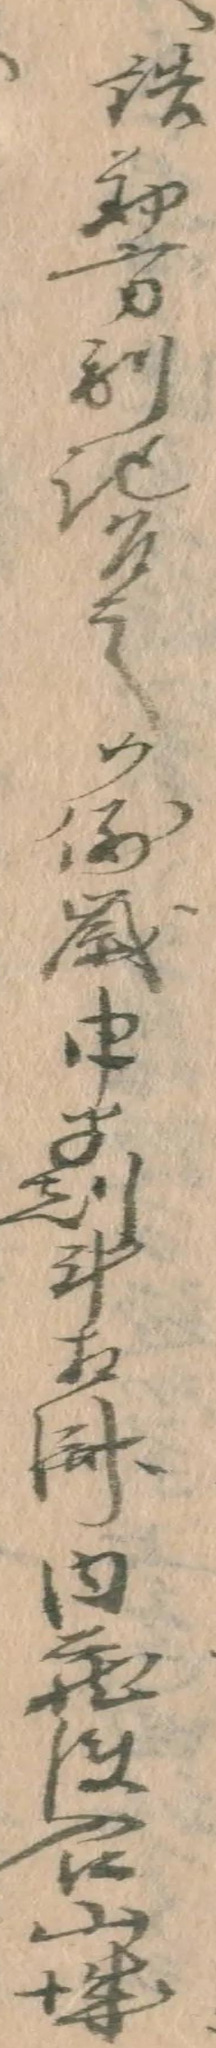へ詰勤方別記有之如例歳申半刻計相済内蔵使入江山城
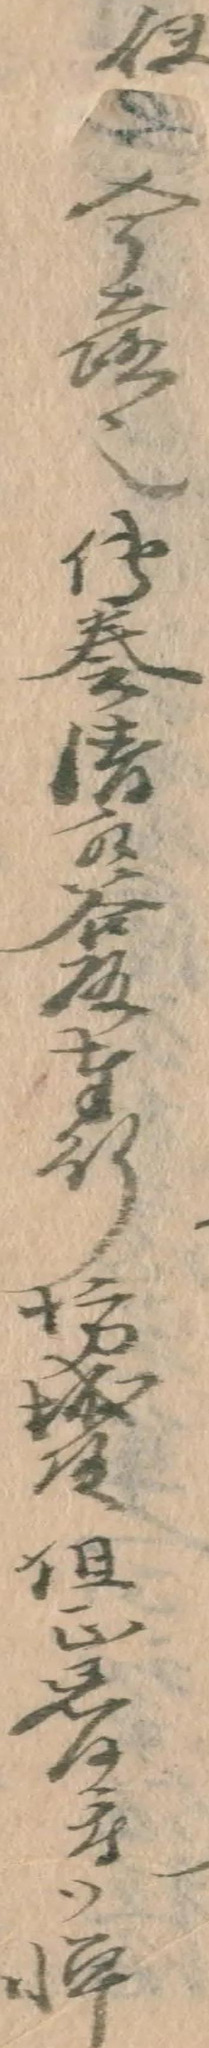使今大路也傳奏清水谷殿奉行坊城殿但正忌日ニ付御憚
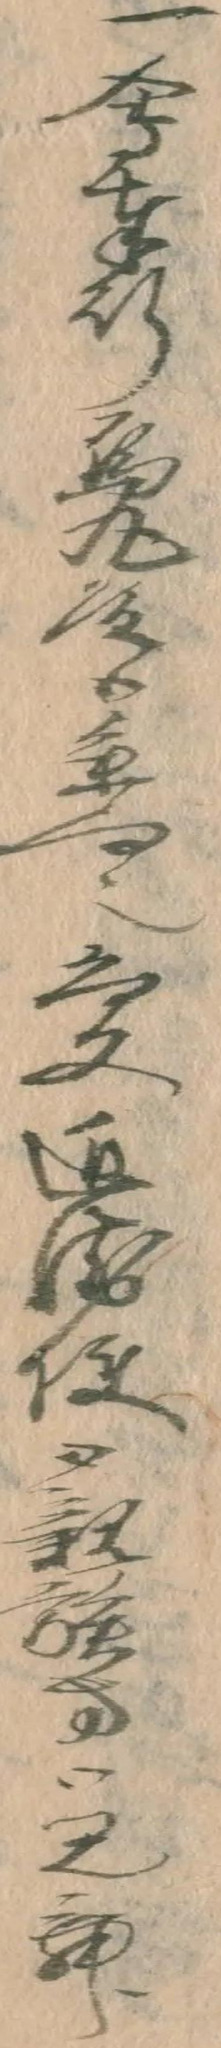一會奉行烏丸殿御参向也尚又近衛殿御親族方御見舞
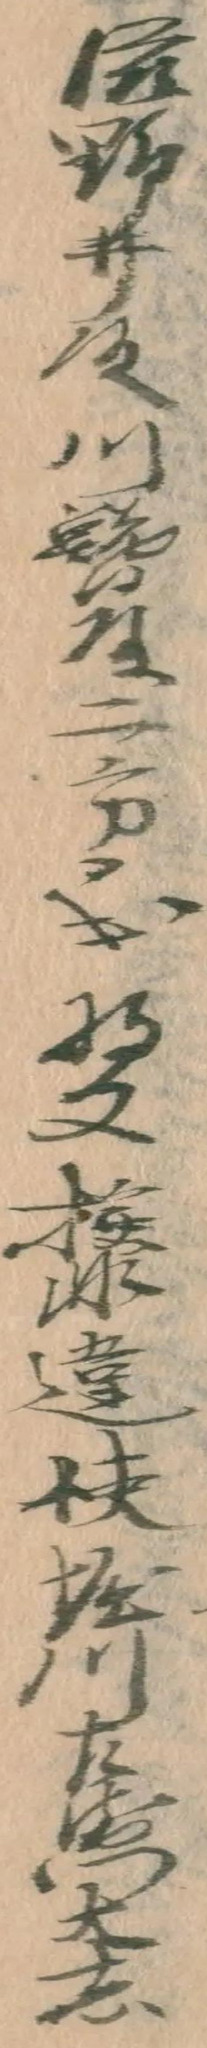滋野井殿川鰭殿二方御出将又検非違使堀川左衛門大志
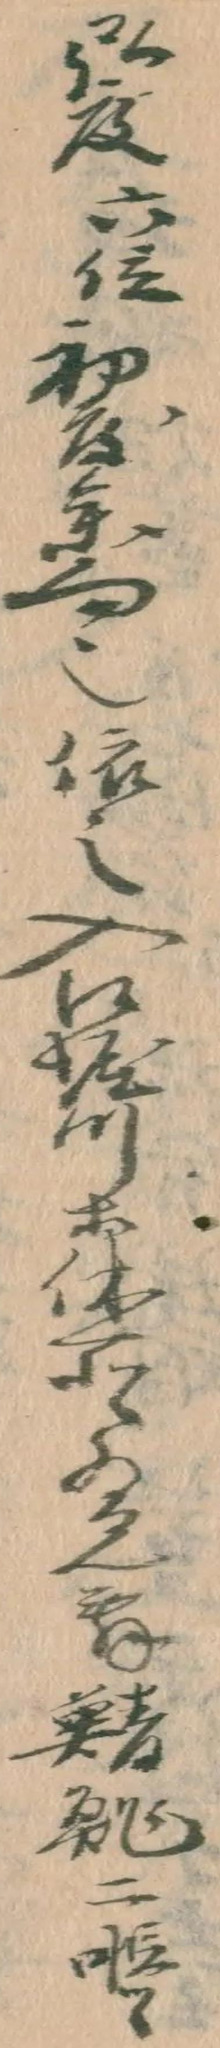弘度六位初度参向也依之入江堀川等休所へ為見舞鯖鮑二喉ツヽ
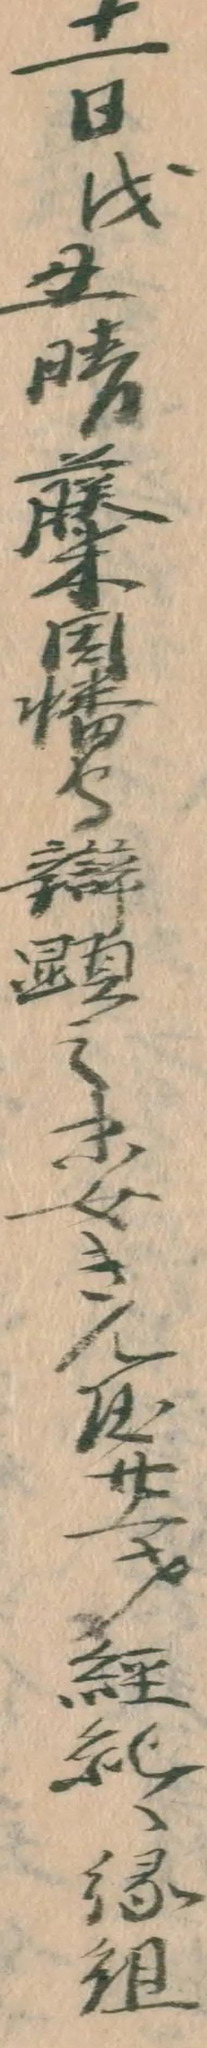十一日戊丑晴藤木因幡守辨顕之末女きん廿一才経紀へ縁組
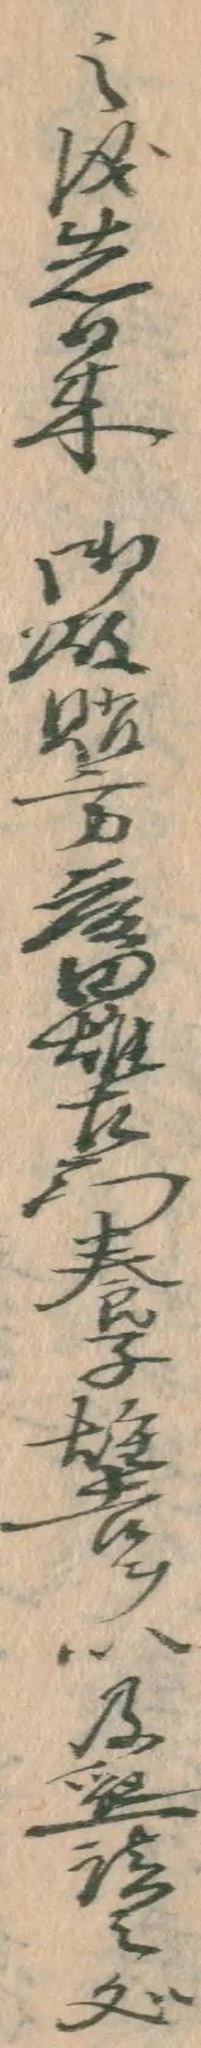之儀先日来御殿賄方藤田雄左衛門養子雄吉ヲ以及懇談之処
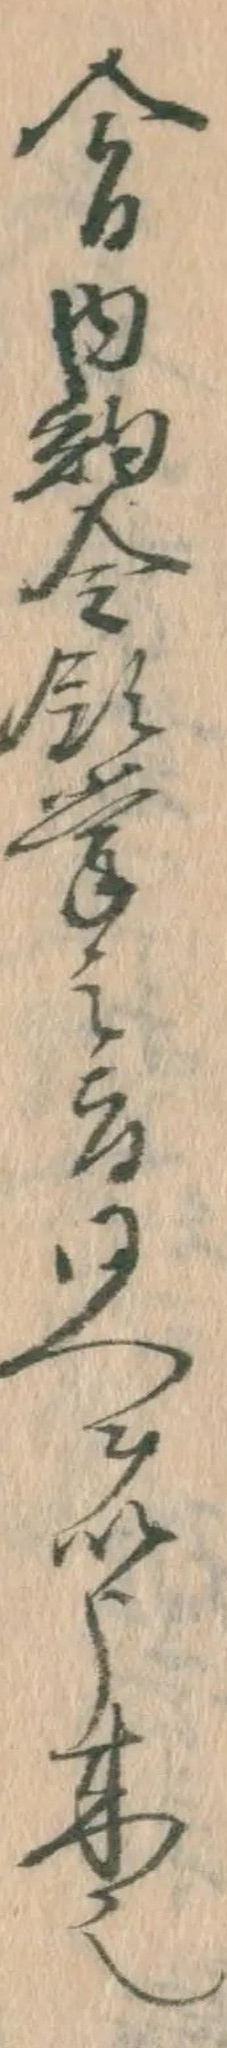今日内約令領掌之旨同人ヲ以申来也
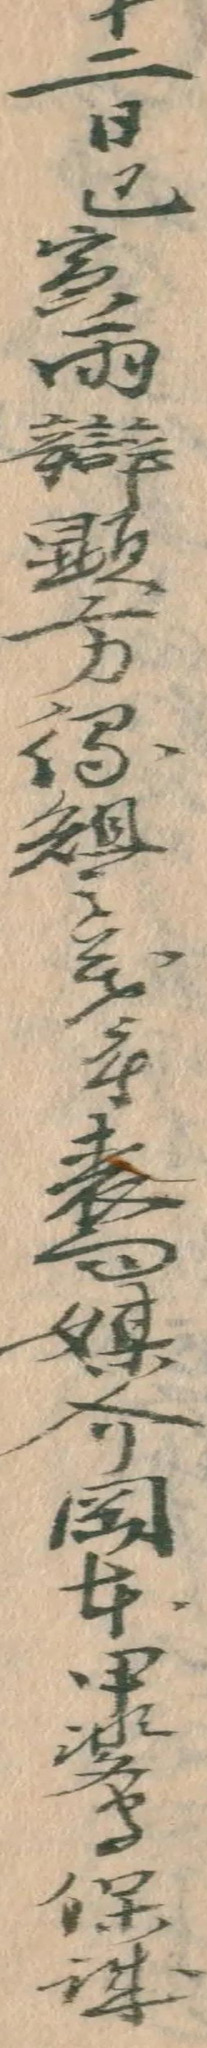十二日己寅両辨顕方縁組之義ニ付表向媒介岡本甲斐守保誠
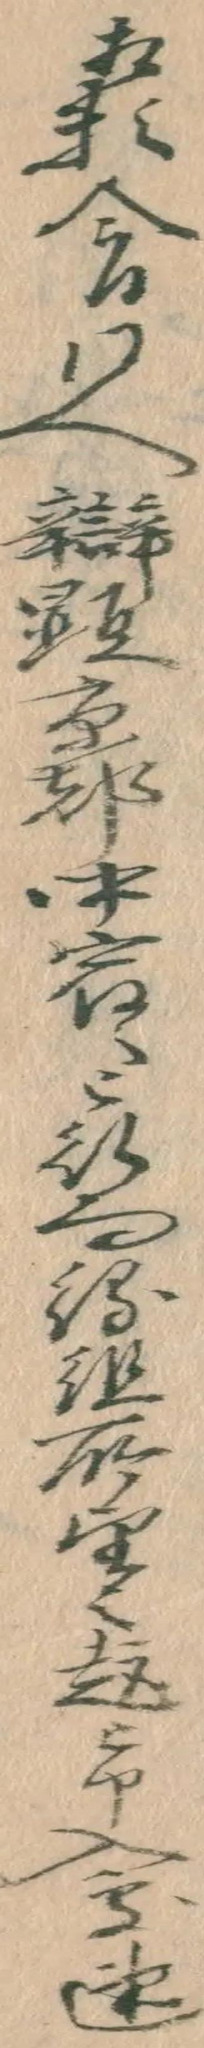相頼今日同人辨顕京都中宿へ被行向縁組所望之趣被申入處速
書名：賀茂社記録. 第69冊
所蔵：国立国会図書館 National Diet Library, JAPAN
